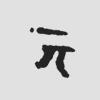亓（其）
